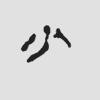少
